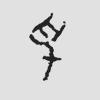色
